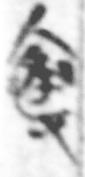褑
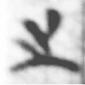之
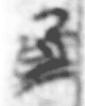爲
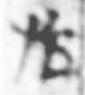○（左）
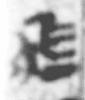飛（騑）
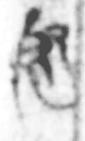卿
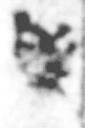事（士）
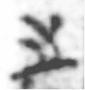之
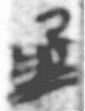爲
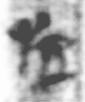○（左）
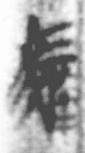○（服）
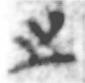大
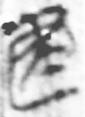建
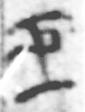巨
